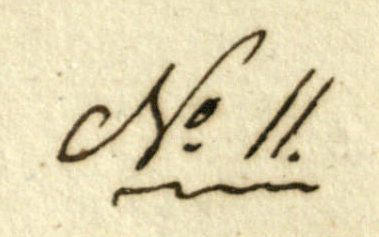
No. 11.
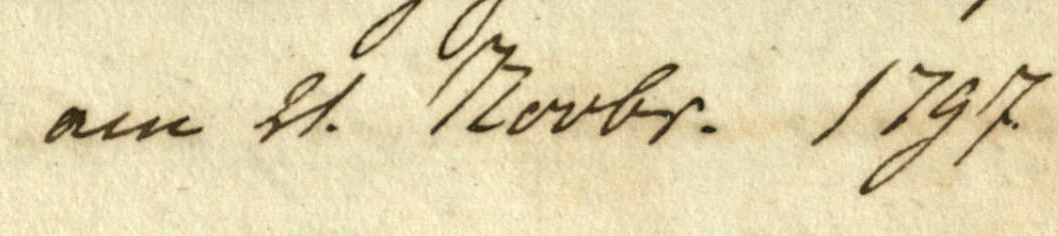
am 21. Novbr. 1797.
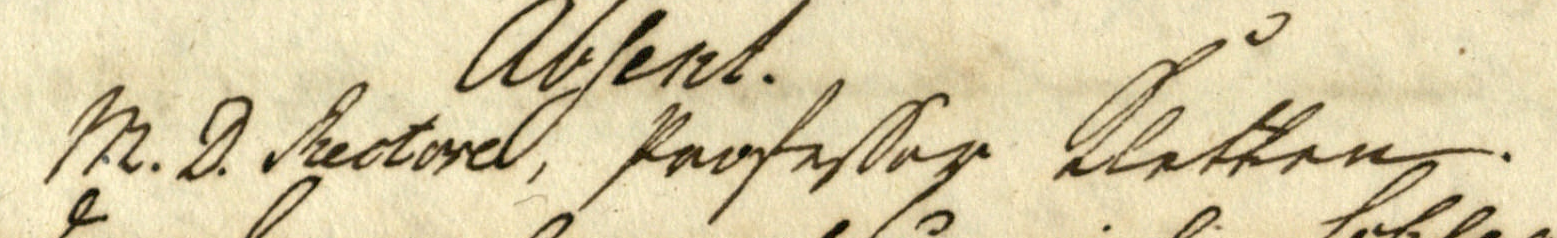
M. D. Rectore, Professor Kletten.
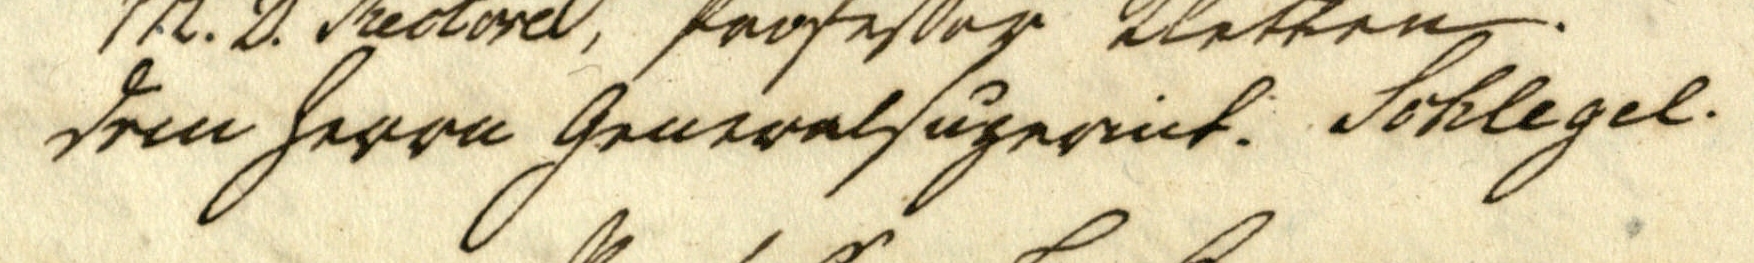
dem Herrn Generalsuperint. Schlegel.
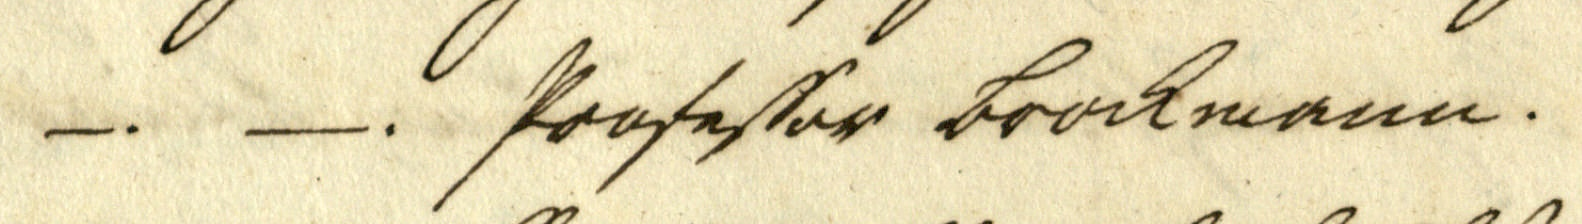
Professor Brockmann.
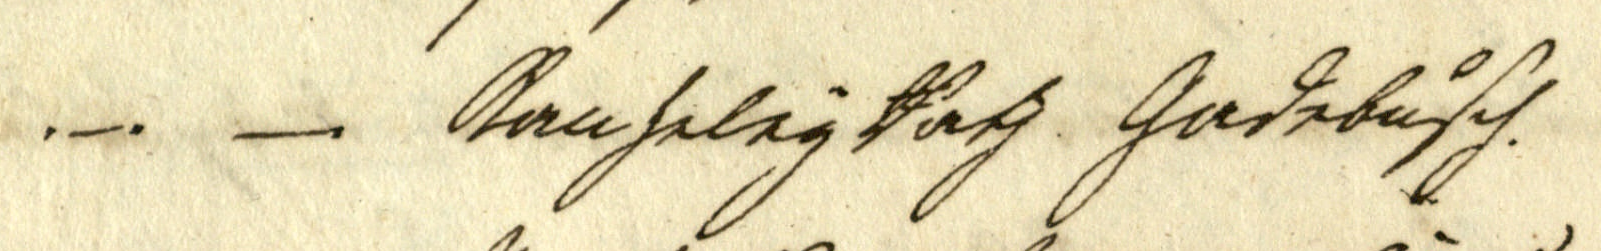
Kanzeleÿ Rath Gadebusch.
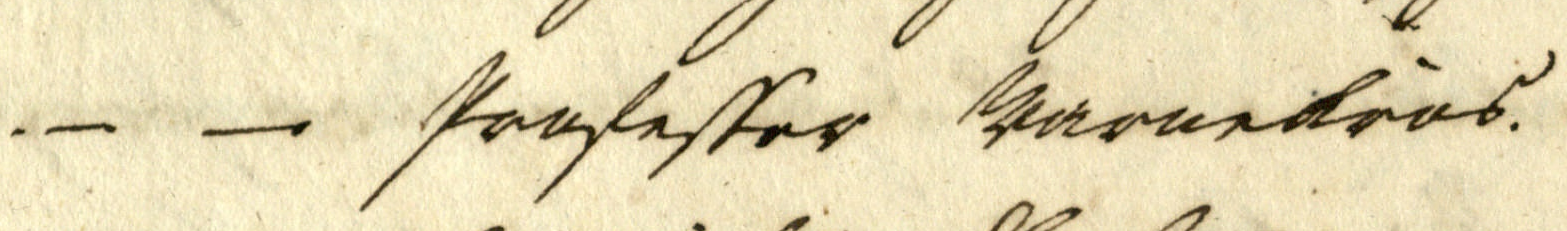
Professor Warnekros.
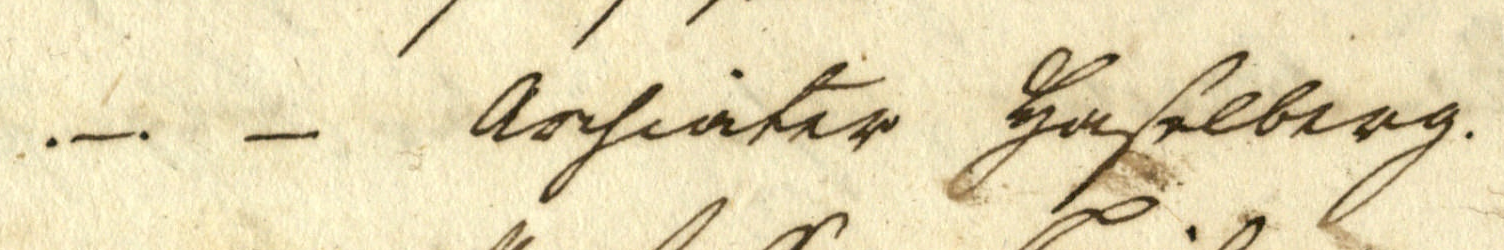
Archiater Haselberg.
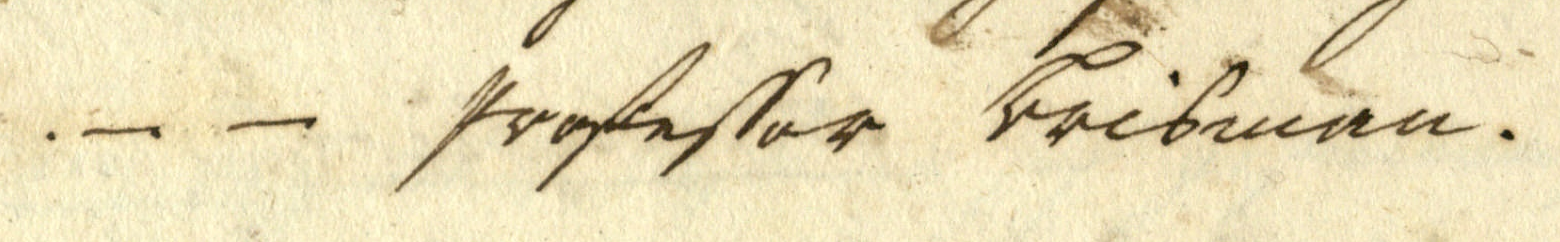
Professor Brisman.
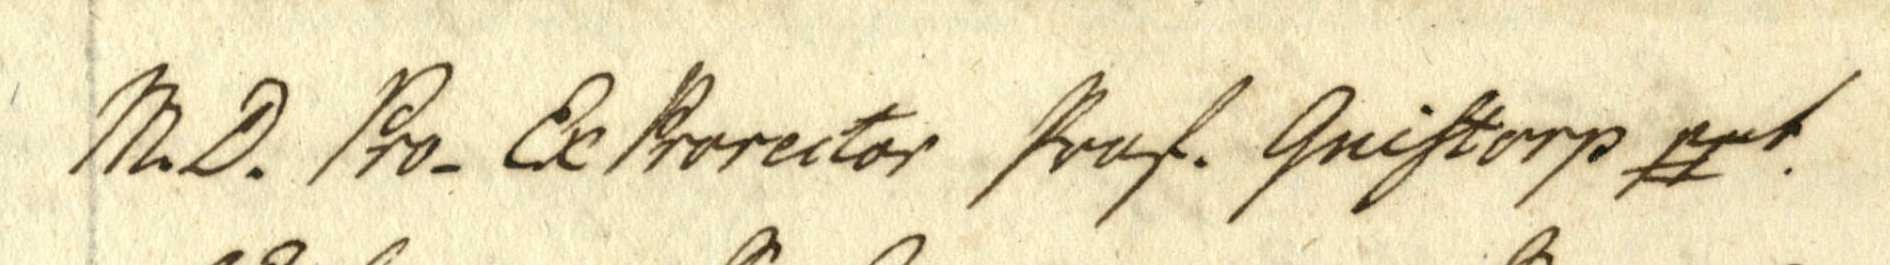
M. D. Pro. Ex Prorector Prof. Quistorp ppt.
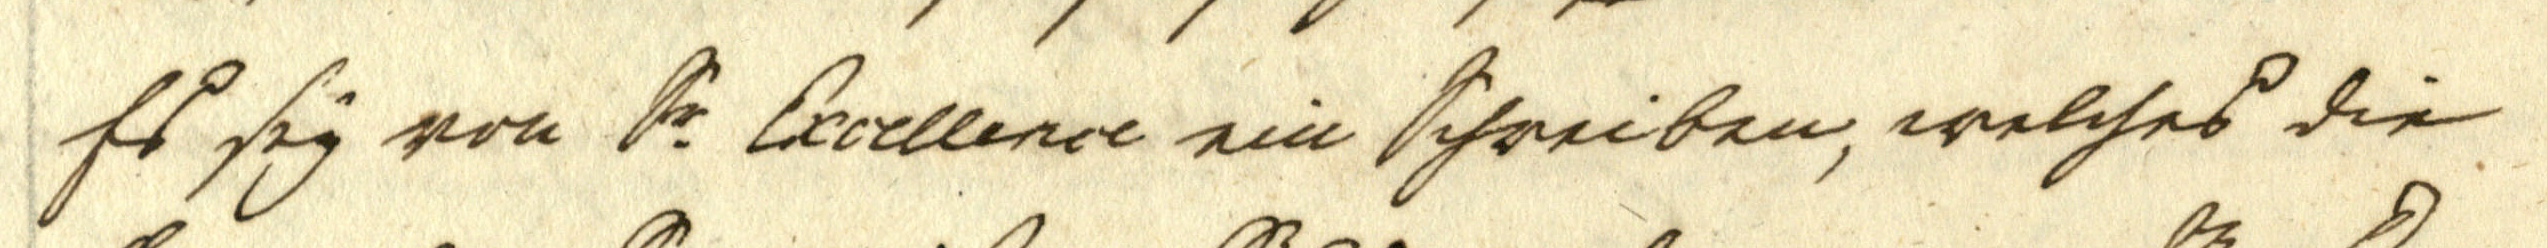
Es sey von Sr. Excellence ein Schreiben, welches die
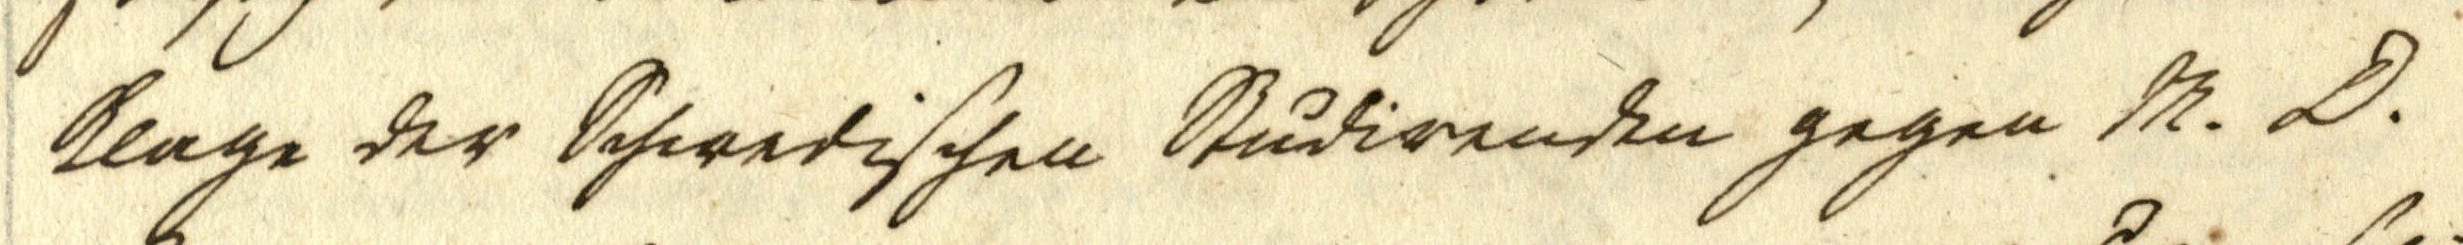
Klage der Schwedischen Studirenden gegen M. D.
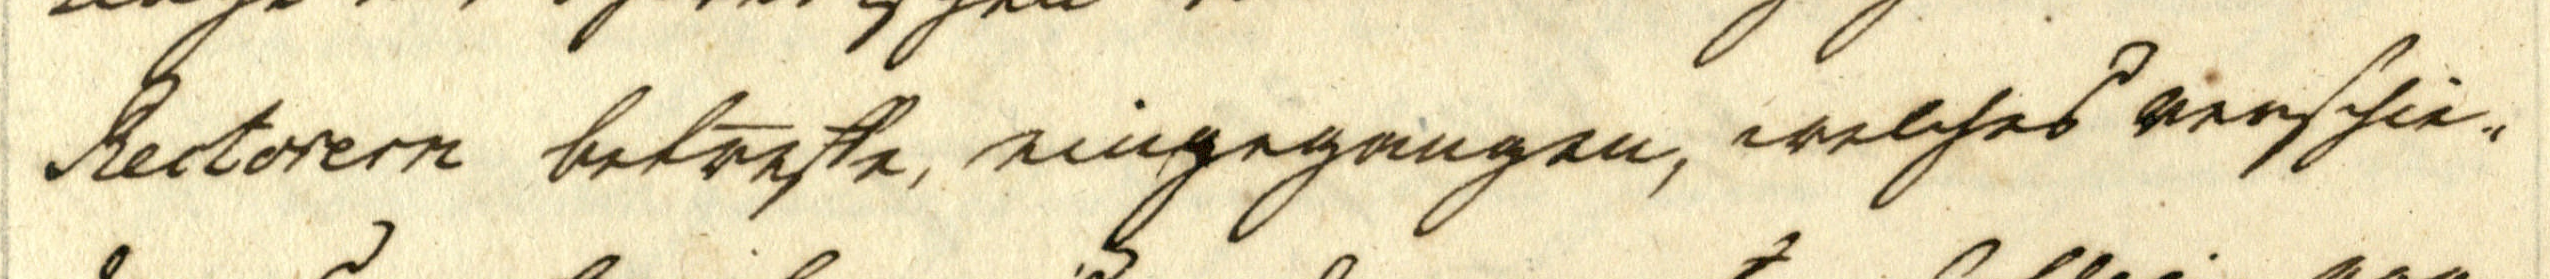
Rectorem betreffe, eingegangen, welches verschie¬
